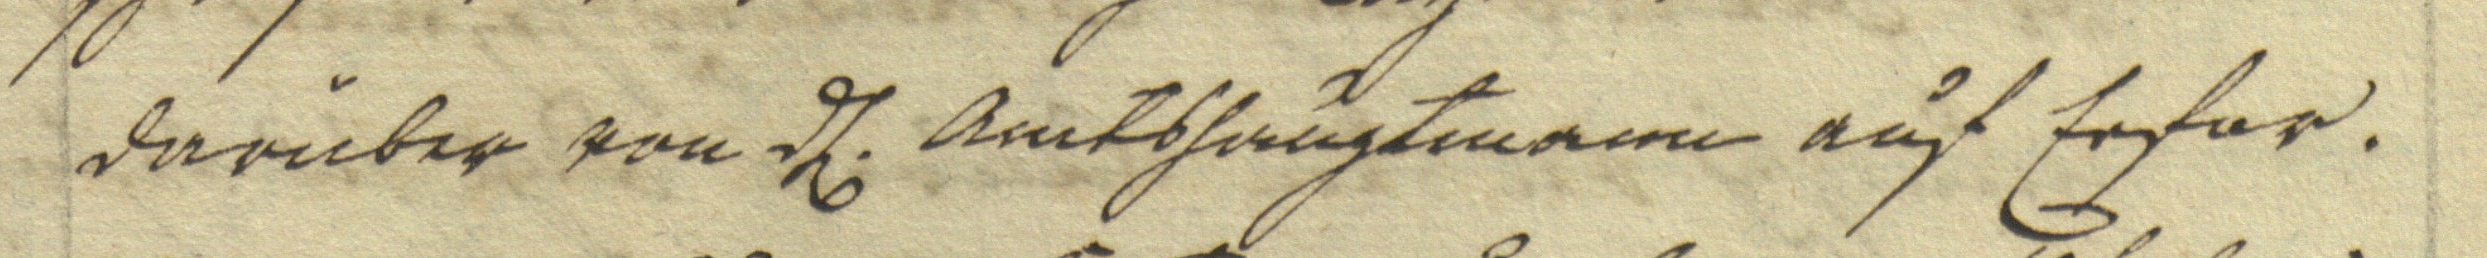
darüber von dh. Amtshauptmann auf Erfor¬
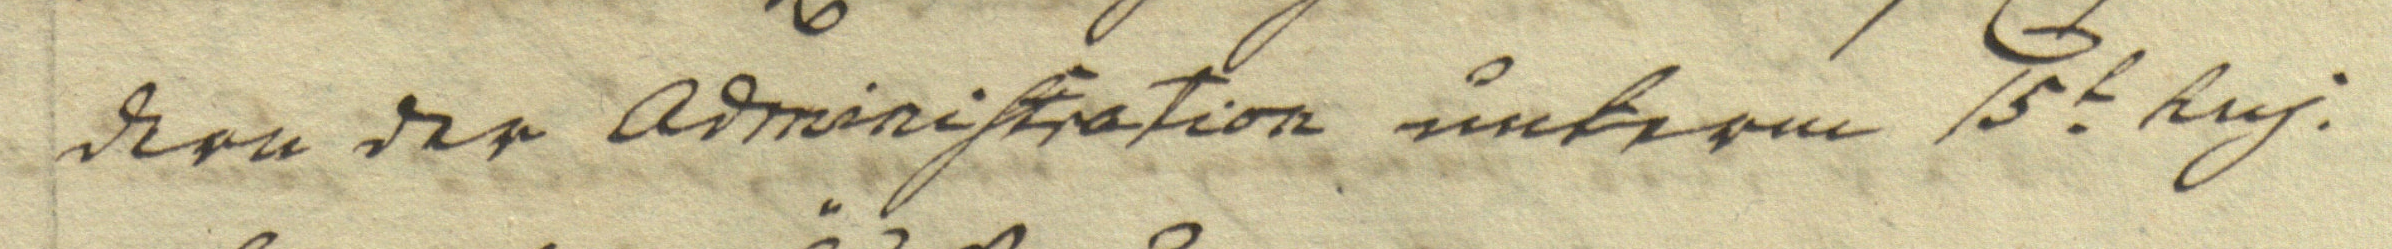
dern der Administration unterm 15 t huj.
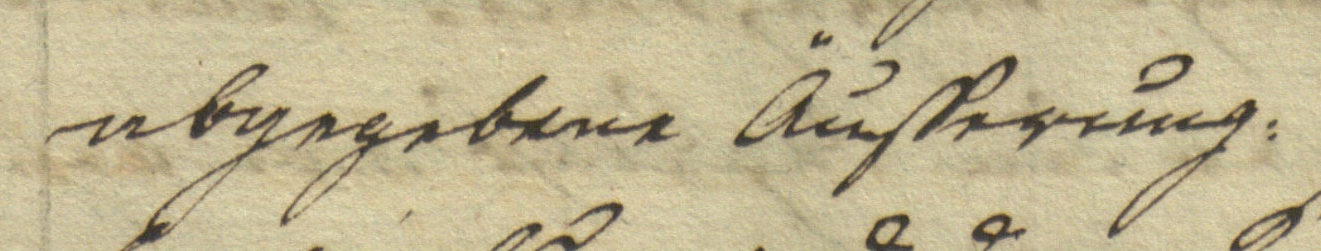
abgegebene Äusserung:
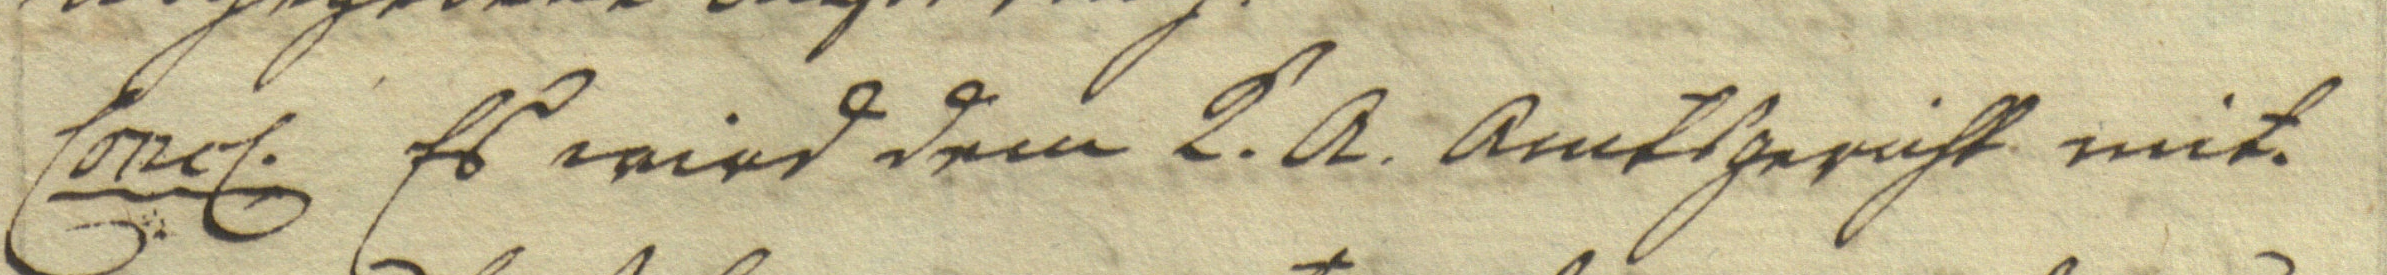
Concl. Es wird dem K. A. Amtsgericht mit¬
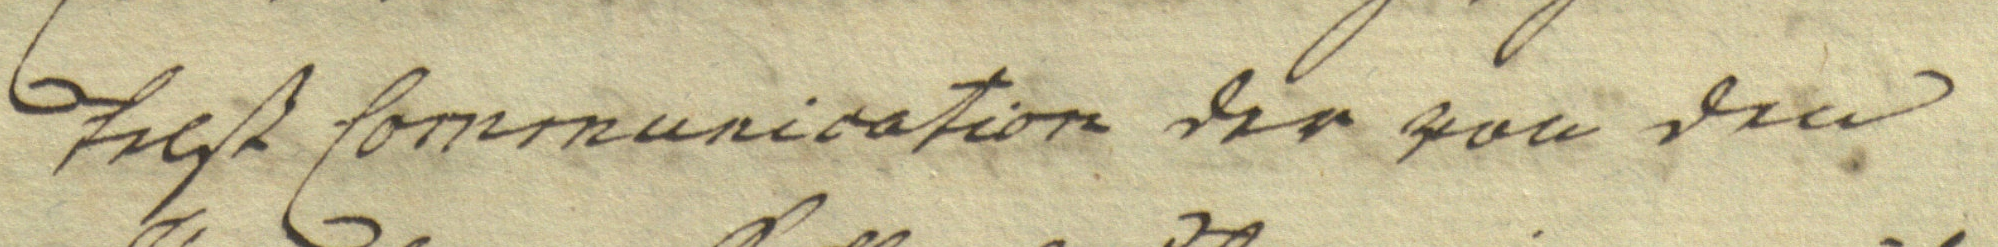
telst Communication der von den
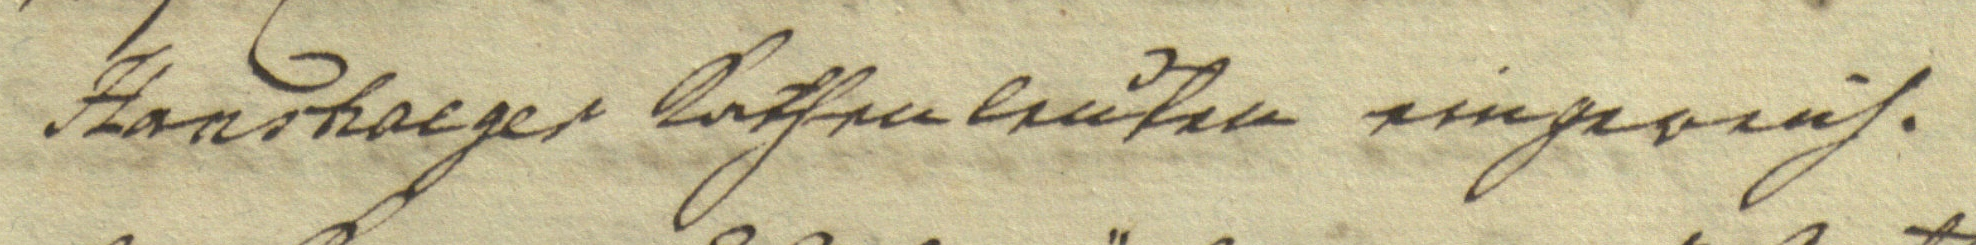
Hanshaeger Kathenleuten eingereich¬
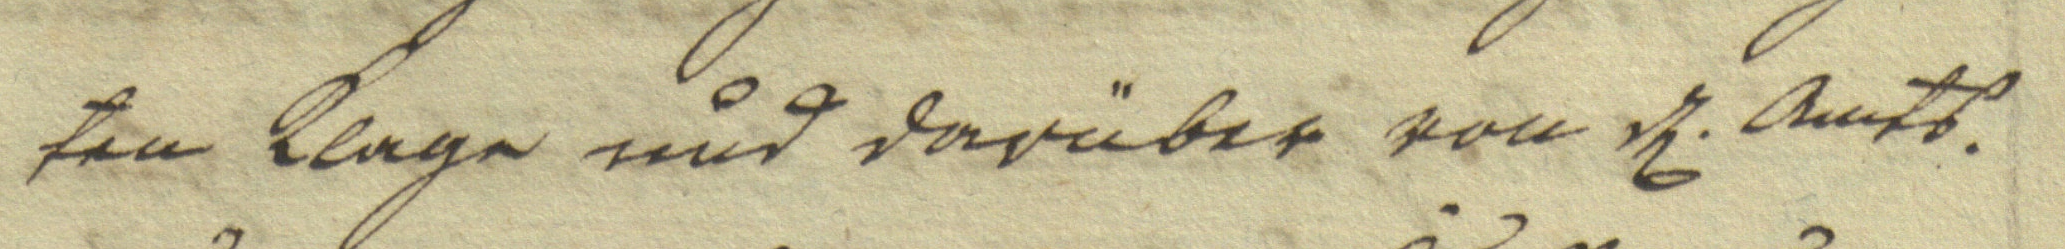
ten Klage und darüber von dh. Amts¬
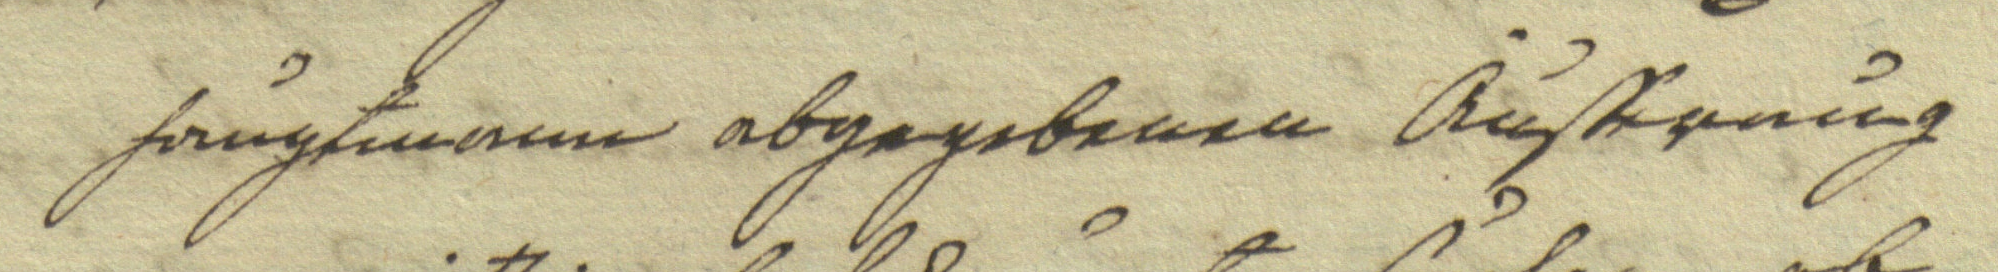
hauptmann abgegebenen Äusserung
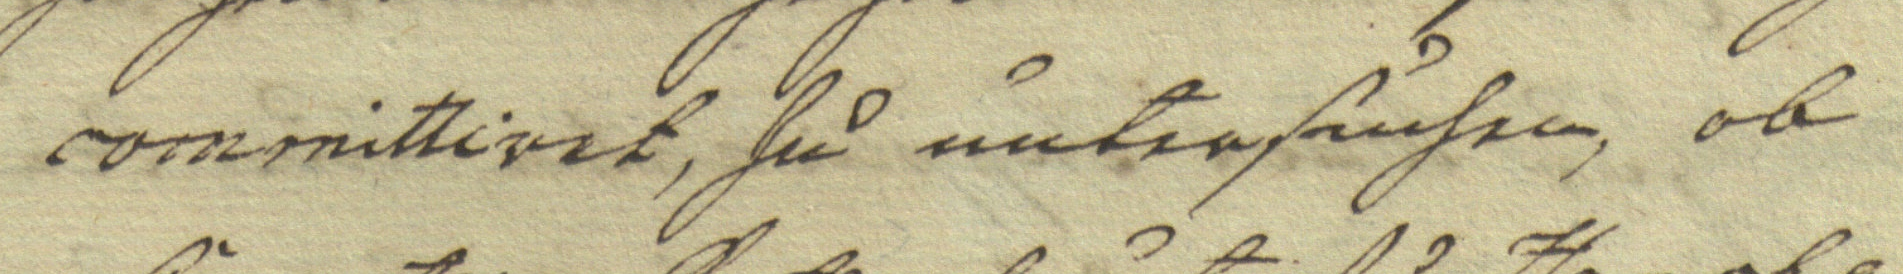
committiret, zu untersuchen, ob
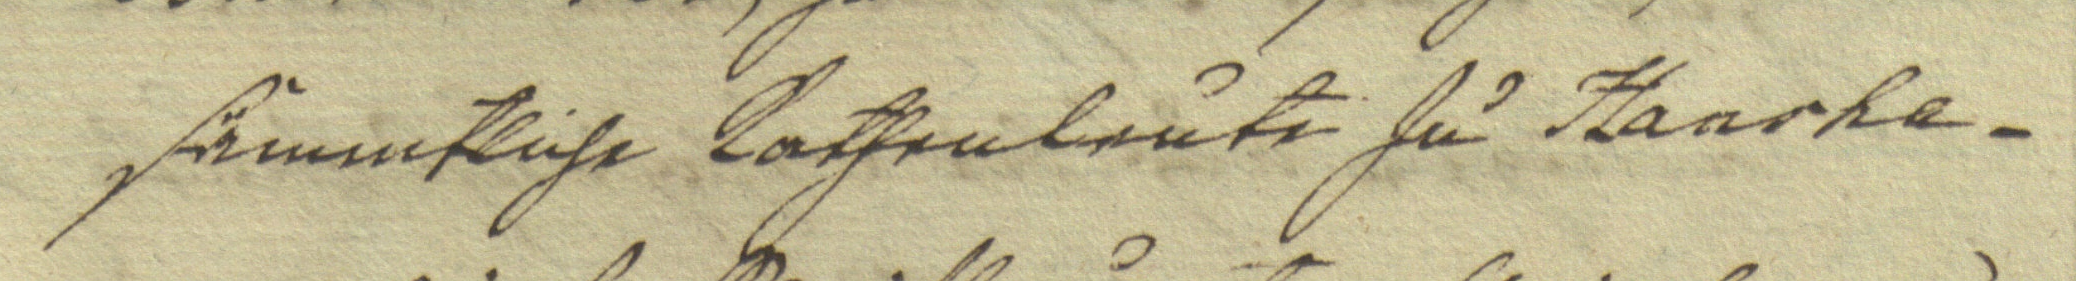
sämmtliche Kathenleute zu Hansha¬
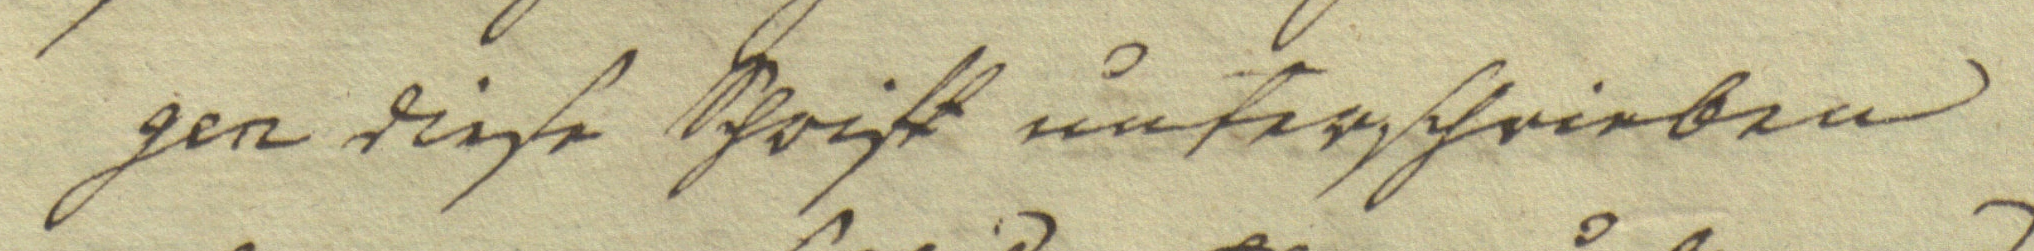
gen diese Schrift unterschrieben
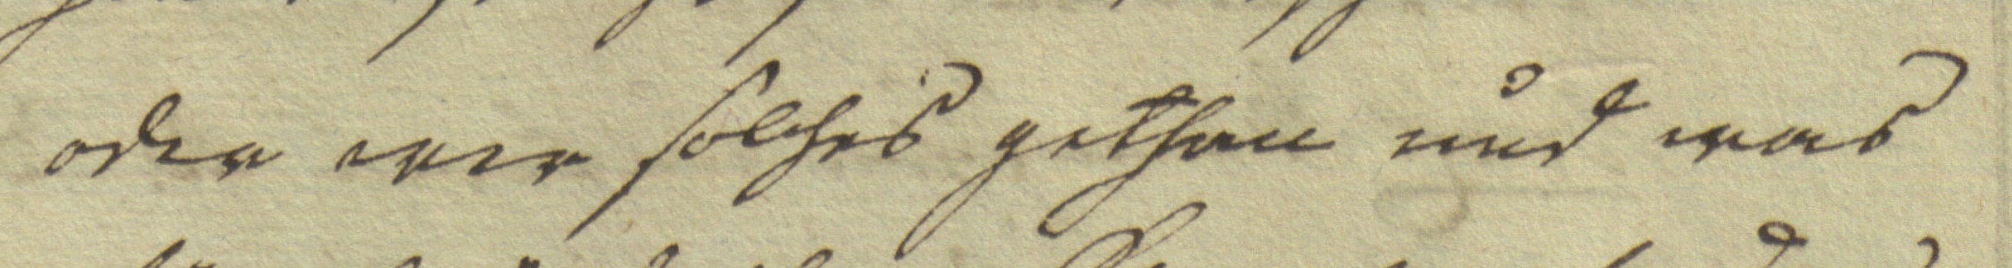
oder wer solches gethan und was
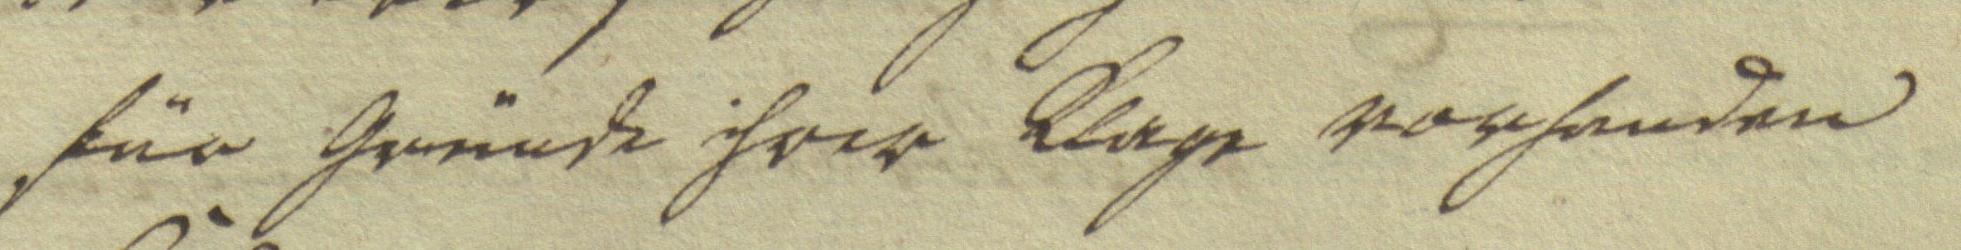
für Gründe ihrer Klage vorhanden
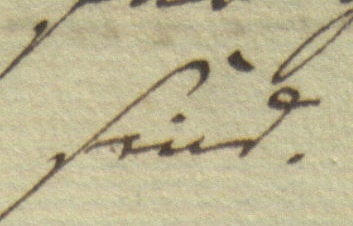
sind.
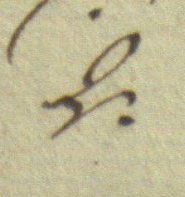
2.
